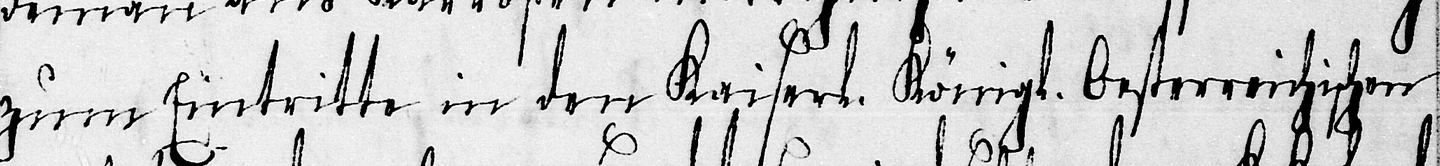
zum Eintritte in den Kaiserl. Königl. Oesterreichischen
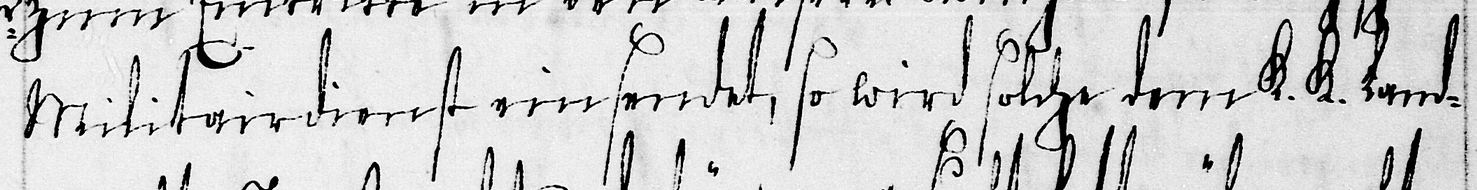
Militairdienst einsendet, so wird solche dem K. K. Lan¬
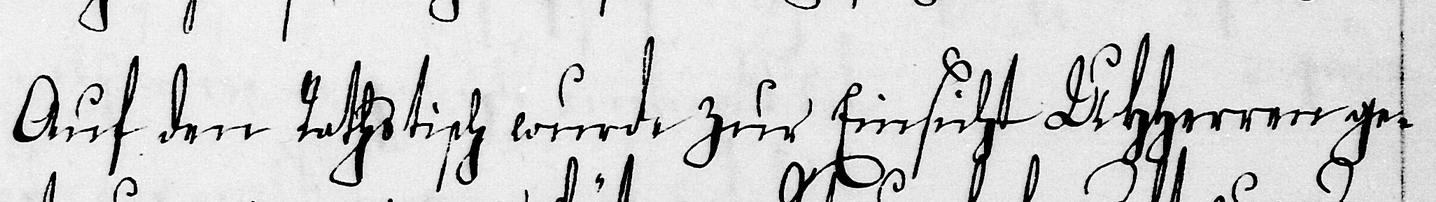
Auf den Rathstisch wurde zur Einsicht UHHerren ge¬
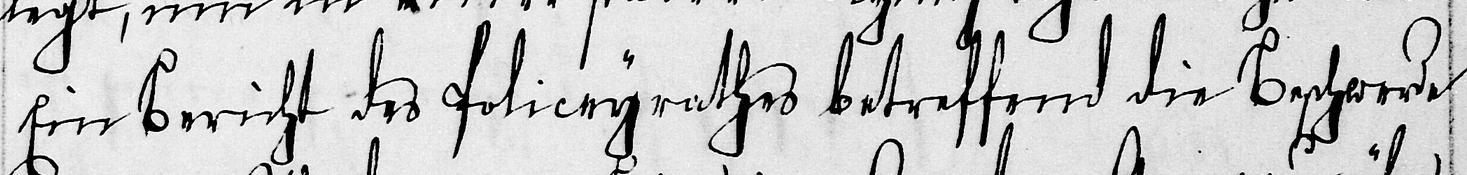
Ein Bericht des Policeyrathes betreffend die Beschwerde
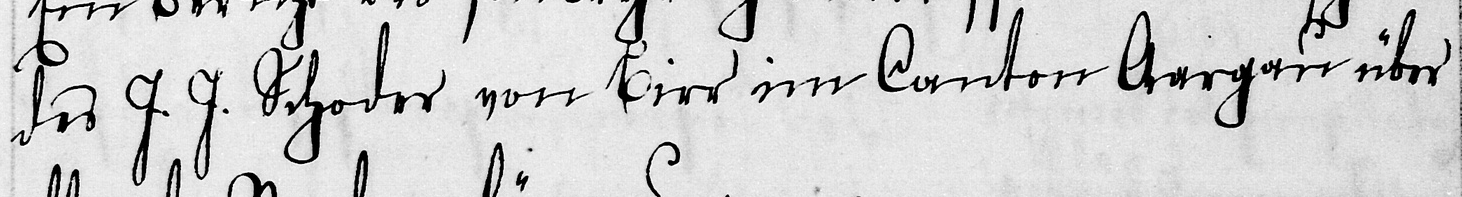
des J. J. Schoder von Birr im Canton Aargau über
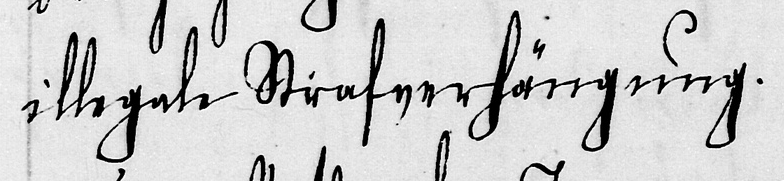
illegale Strafverhängung.
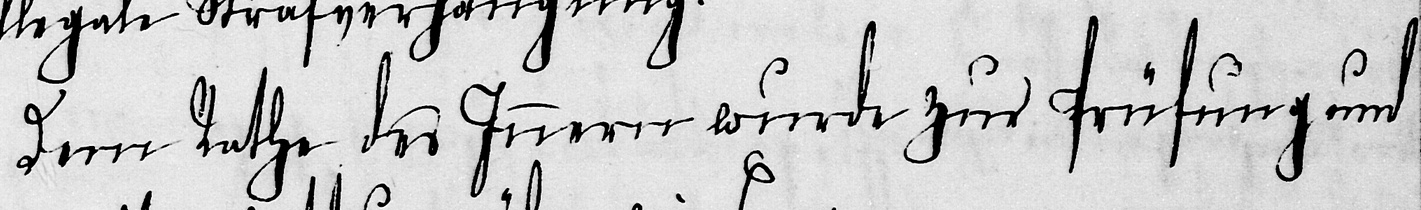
Dem Rathe des Innern wurde zur Prüfung und
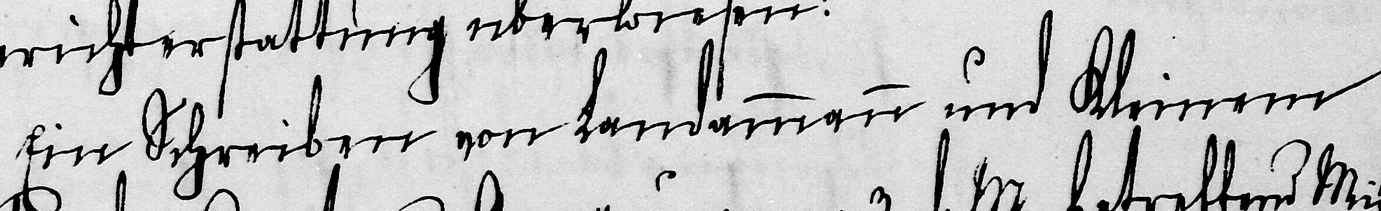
Ein Schreiben von Landammann und Kleinem
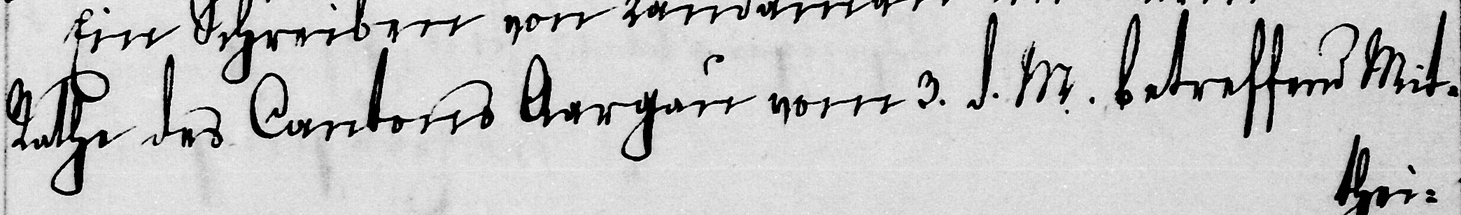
Rathe des Cantons Aargau vom 3. d. M. betreffend Mit-
